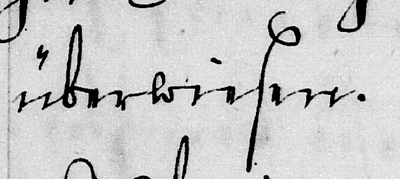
überwiesen.
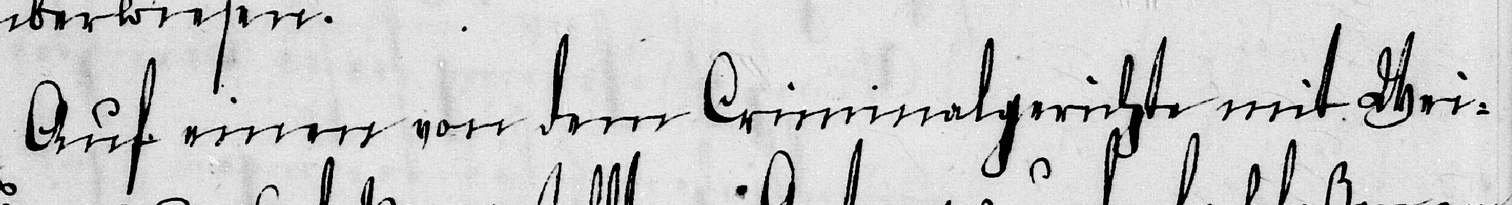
Auf einen von dem Criminalgerichte mit Wei¬
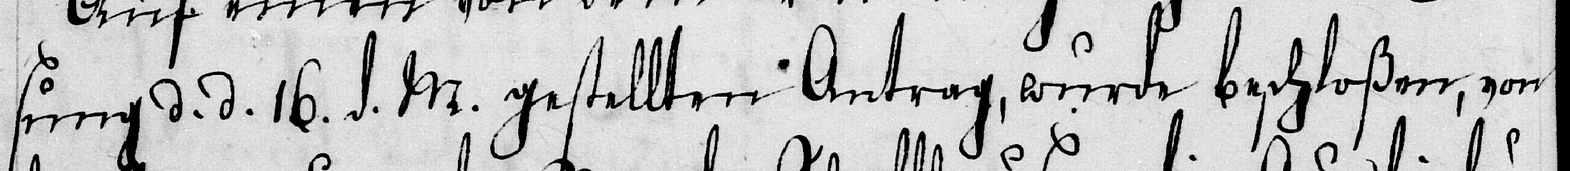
sung d. d. 16. d. M. gestellten Antrag, wurde beschloßen, von
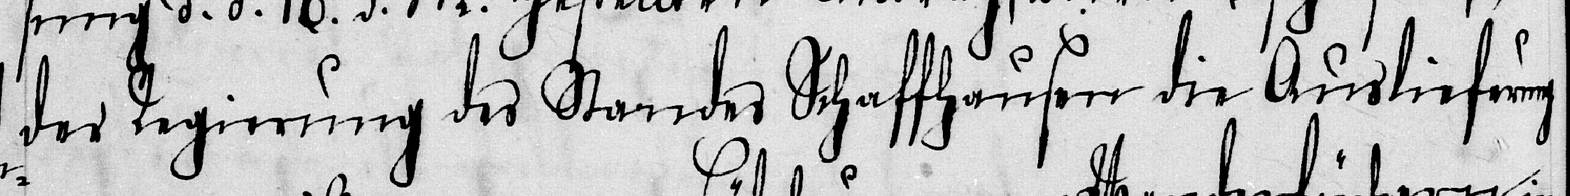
der Regierung des Standes Schaffhausen die Auslieferung
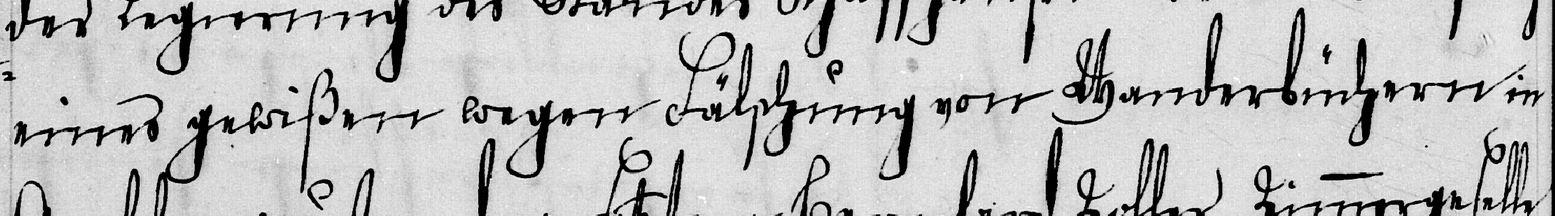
eines gewißen wegen Fälschung von Wanderbüchern im
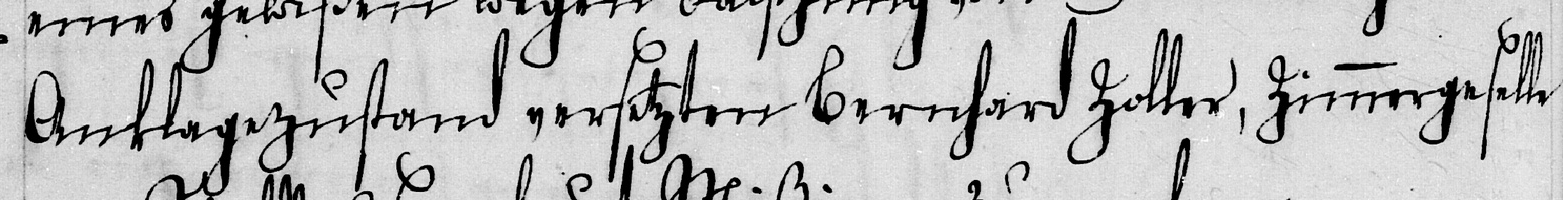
Anklagezustand versetzten Bernhard Zoller, Zimmergese¬
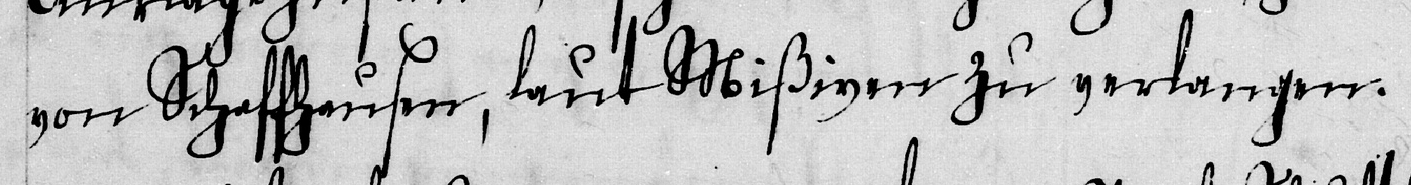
von Schaffhausen, laut Mißiven zu verlangen.
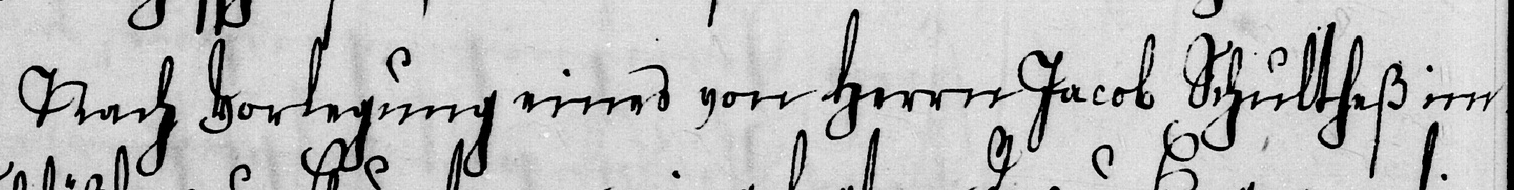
Nach Vorlegung eines von Herrn Jacob Schultheß im
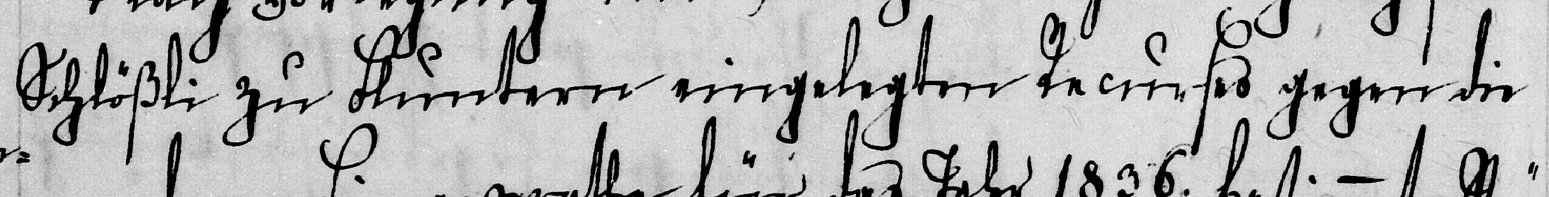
Schlößli zu Fluntern eingelegten Recurses gegen die
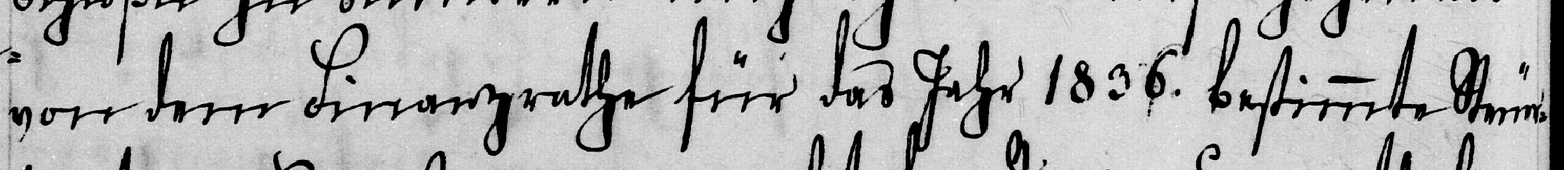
von dem Finanzrathe für das Jahr 1836. bestimmte Steue¬
